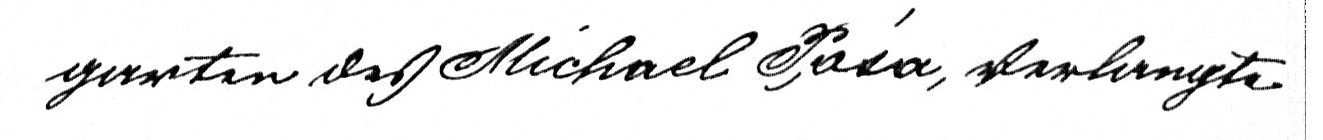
garten des Michael Posá, verlangte
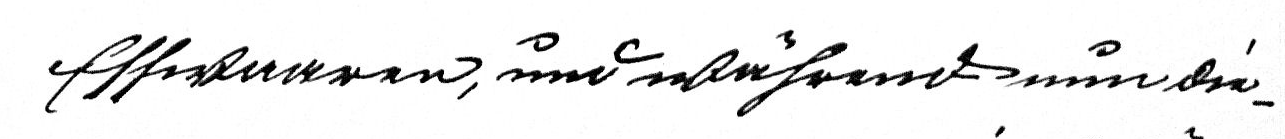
Esswaaren, und während nun die¬
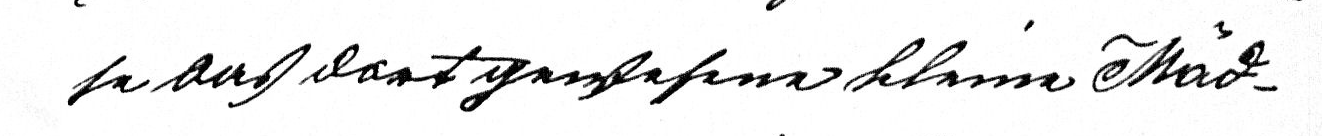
se das dort gewesene kleine Mäd¬
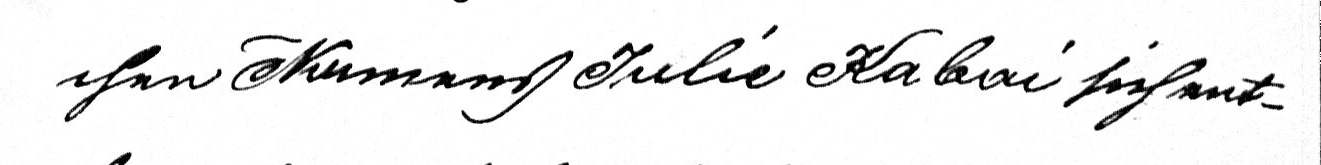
chen Namens Julie Kabai sich ent¬
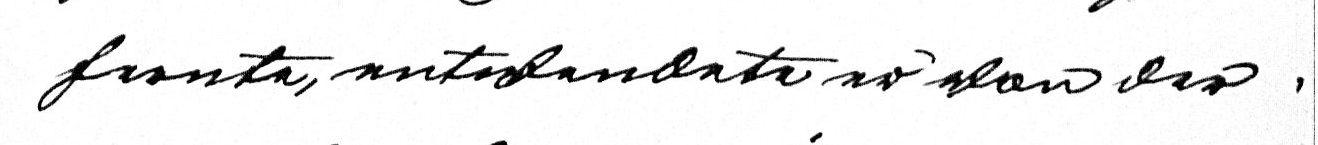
fernte, entwendete er von der
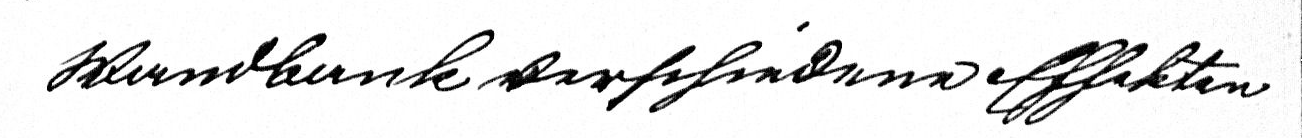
Wandbank verschiedene Effekten
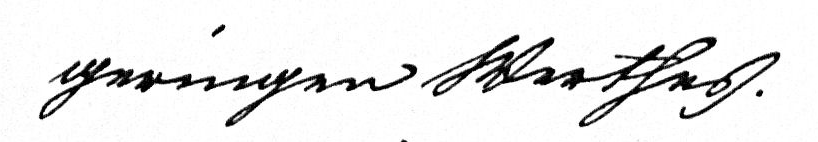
geringen Werthes.
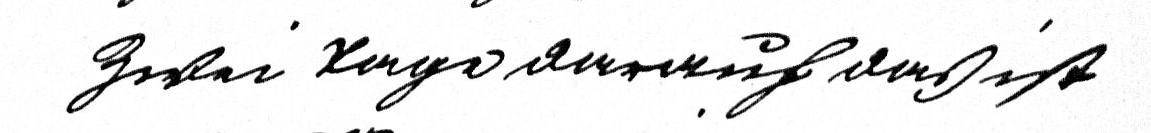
Zwei Tage darauf das ist
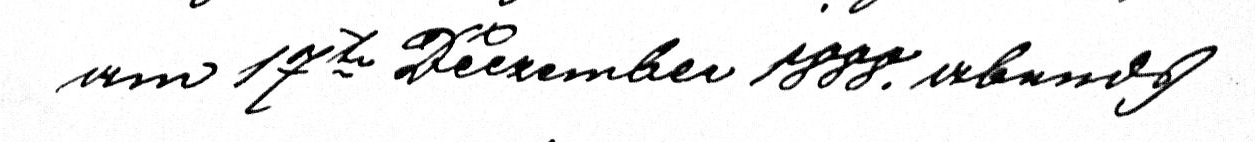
am 17ten Deczember 1888. abends
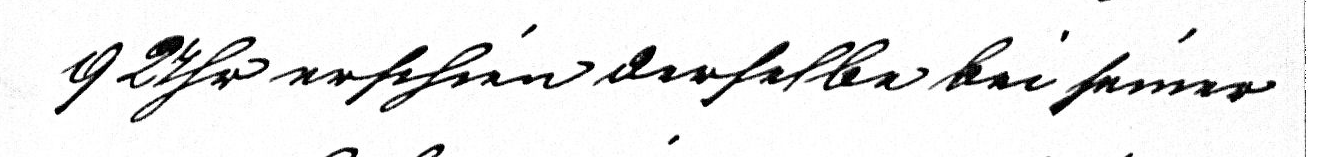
9 Uhr erschien derselbe bei seiner
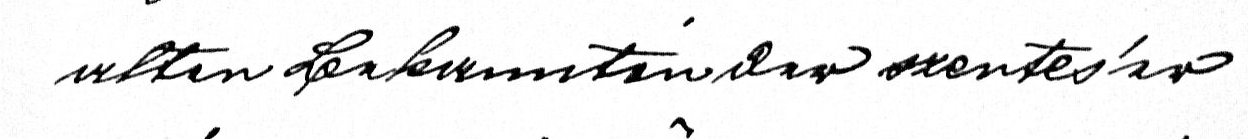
alten Bekanntin der szentes'er
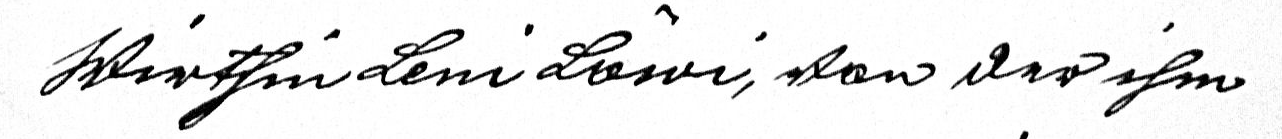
Wirthin Lein Löwi, von der ihm
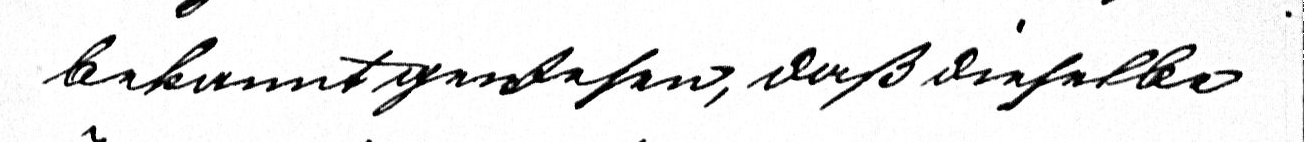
bekannt gewesen, daß dieselbe
